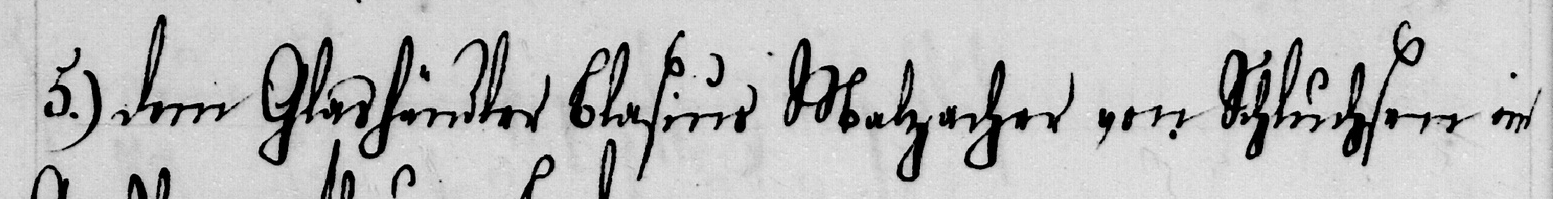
5.) dem Glashändler Blasius Malzacher von Schluchsen im
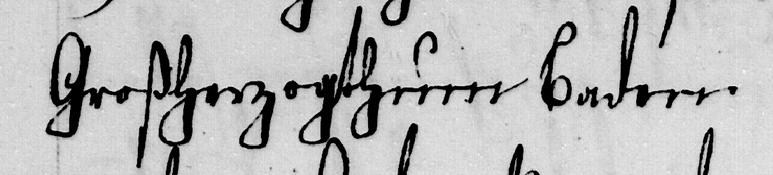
Großherzogthum Baden.
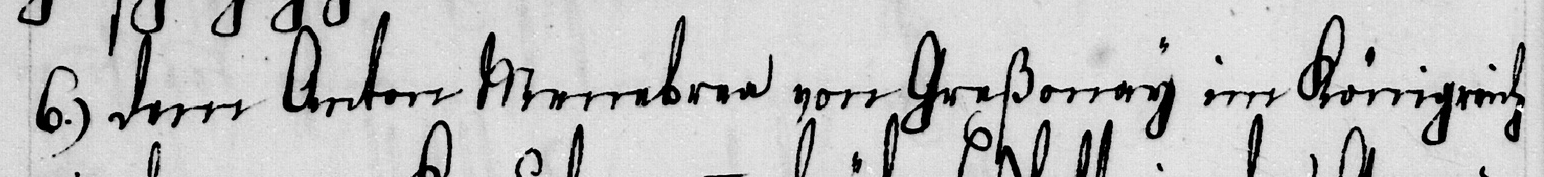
6.) dem Anton Menebrea von Greßonay im Königreich
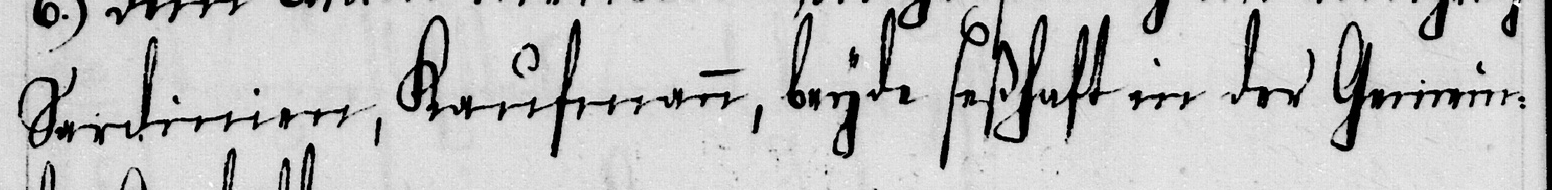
Sardinien, Kaufmann, beyde seßhaft in der Gemein¬
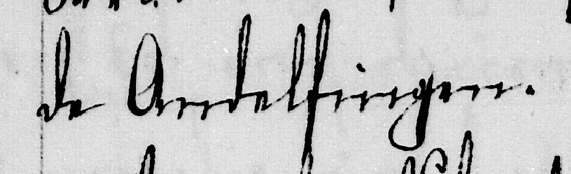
de Andelfingen.
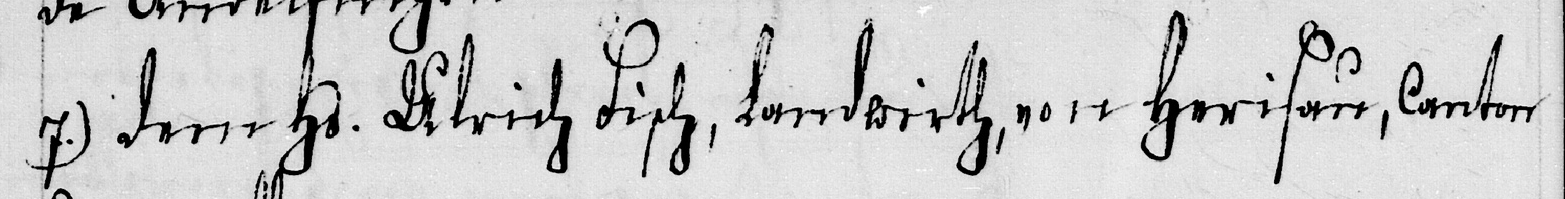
7.) dem Hs. Ulrich Fisch, Landwirth, von Herisau, Canton
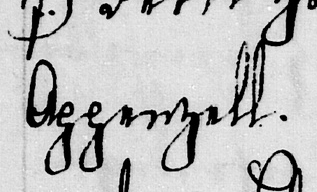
ppenzell.
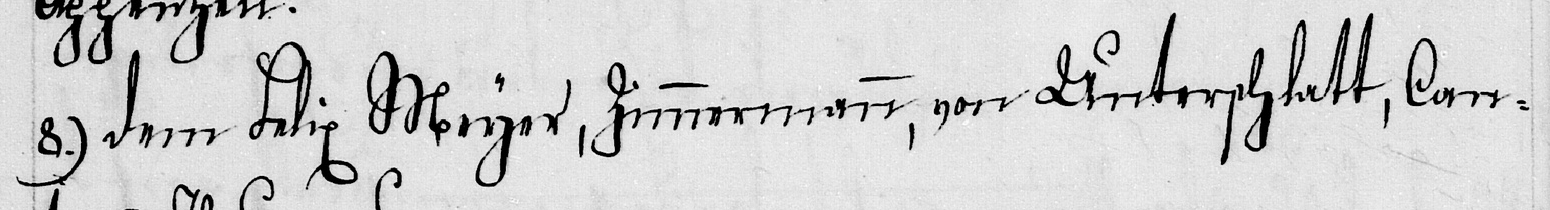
8.) dem Felix Meyer, Zimmermann, von Unterschlatt, Can¬
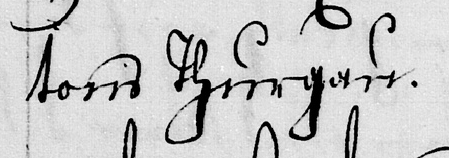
tons Thurgau.
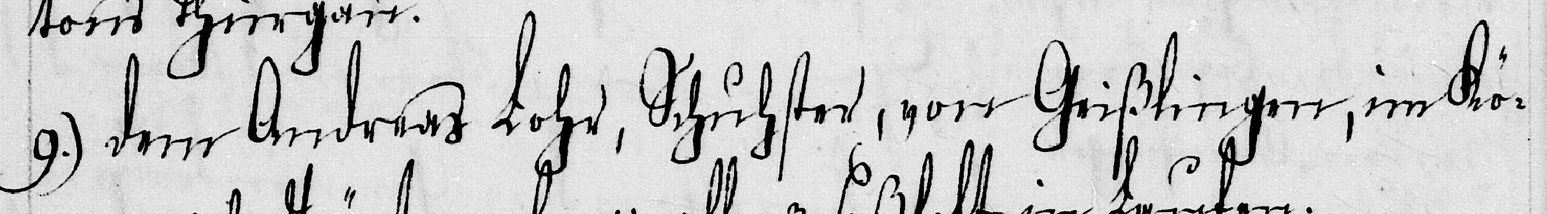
9.) dem Andreas Lohr, Schuster, von Geißlingen, im Kö¬
